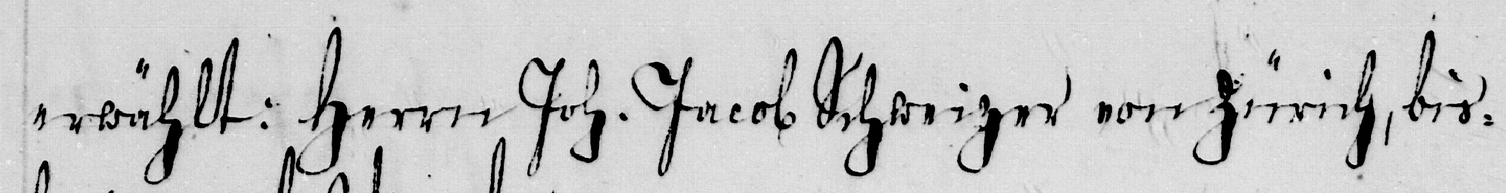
erwählt: Herrn Joh. Jacob Schweizer von Zürich, bis¬
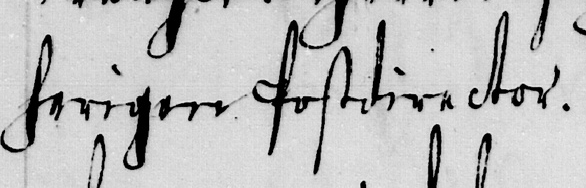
herigen Postdirector.
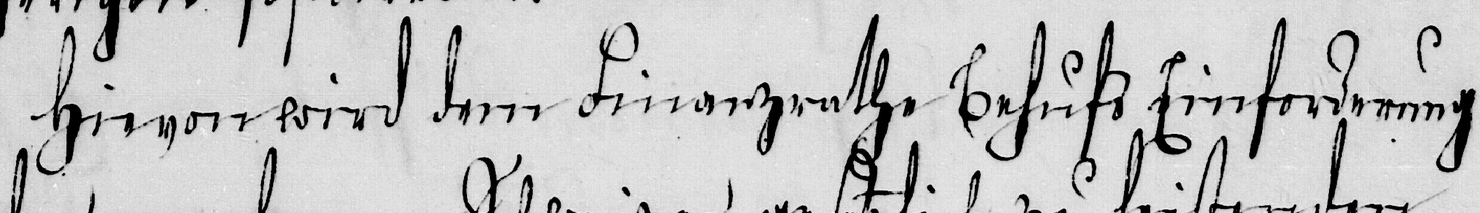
Hiervon wird dem Finanzrathe Behufs Einforderung
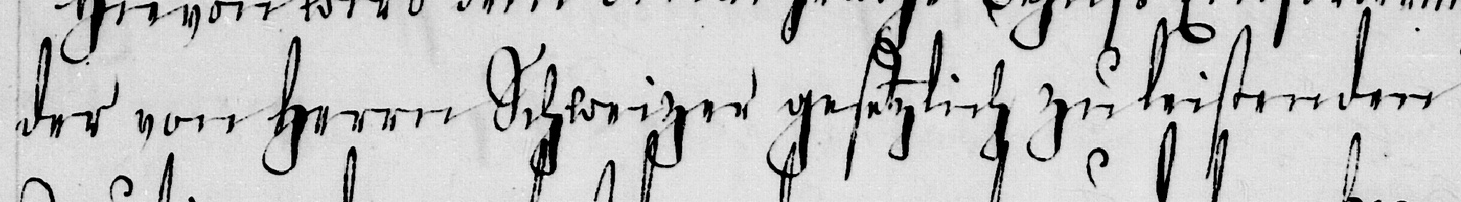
der von Herrn Schweizer gesetzlich zu leistenden
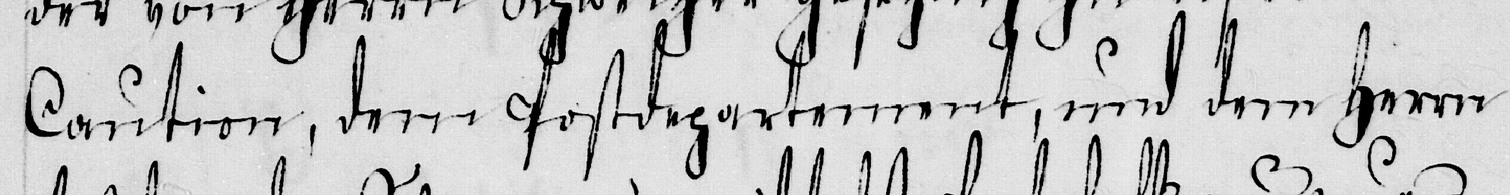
Caution, dem Postdepartement, und dem Herrn
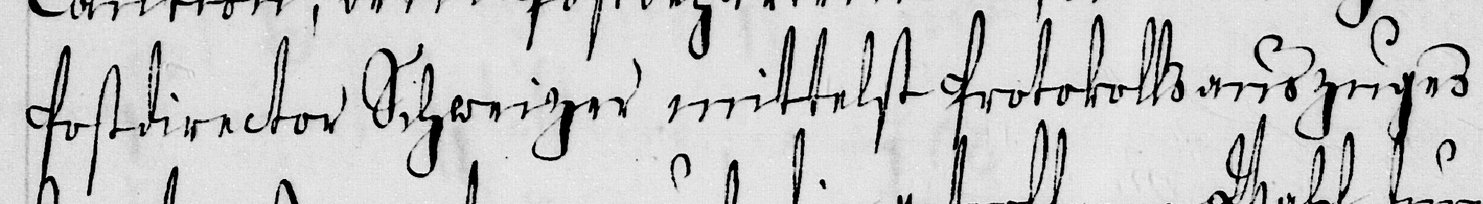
Postdirector Schweizer mittelst Protokollsauszuges
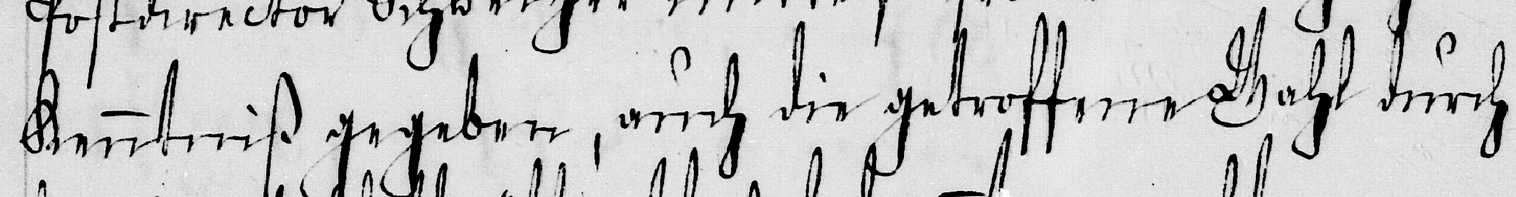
Kenntniß gegeben, auch die getroffene Wahl durch
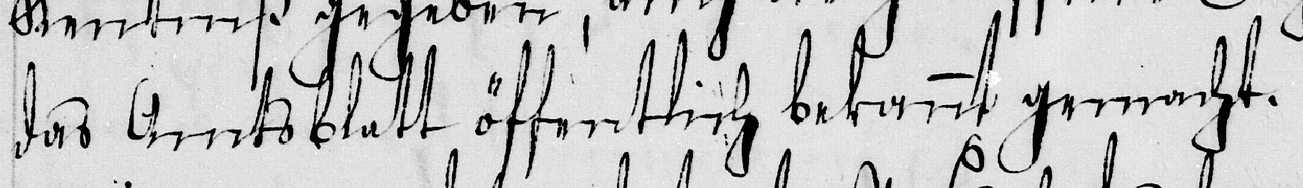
das Amtsblatt öffentlich bekannt gemacht.
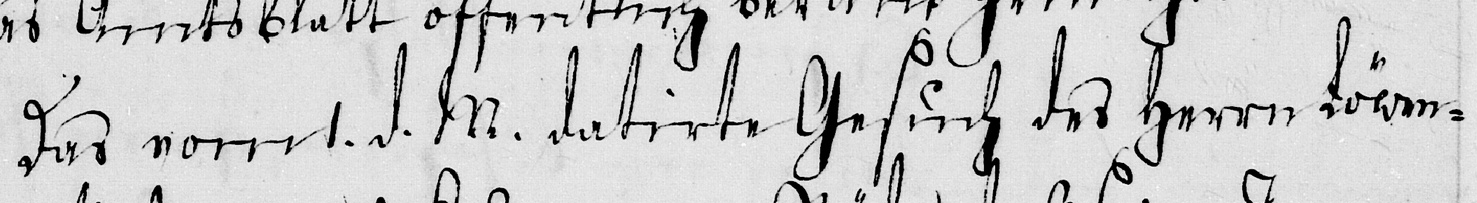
Das vom 1. d. M. datirte Gesuch des Herrn Löwen¬
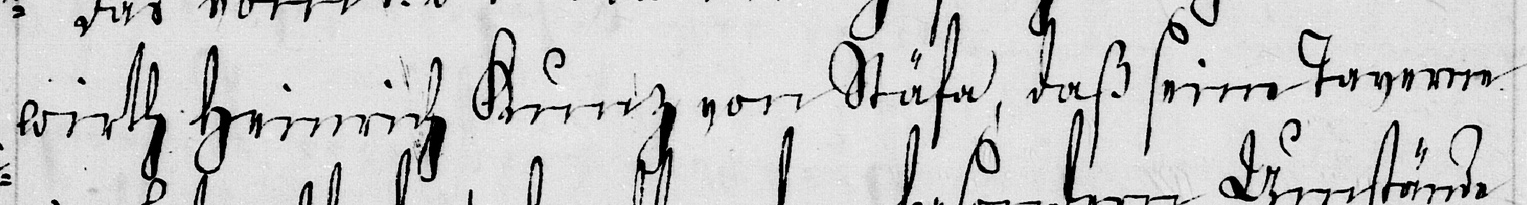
wirth Heinrich Kunz von Stäfa, daß seine Taverne
